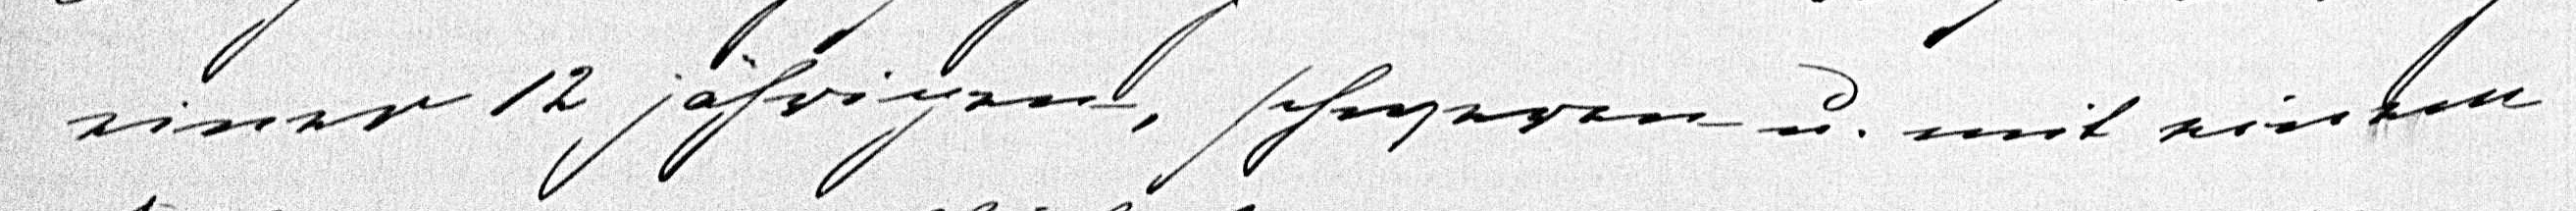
einer 12jährigen, schweren u. mit einem
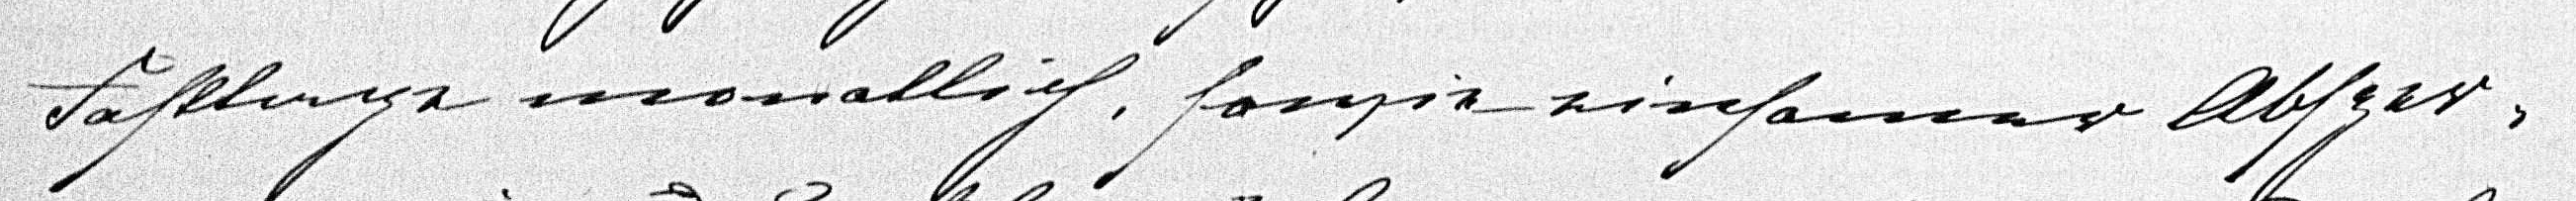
Fasttage monatlich, sowie einsamer Absper¬
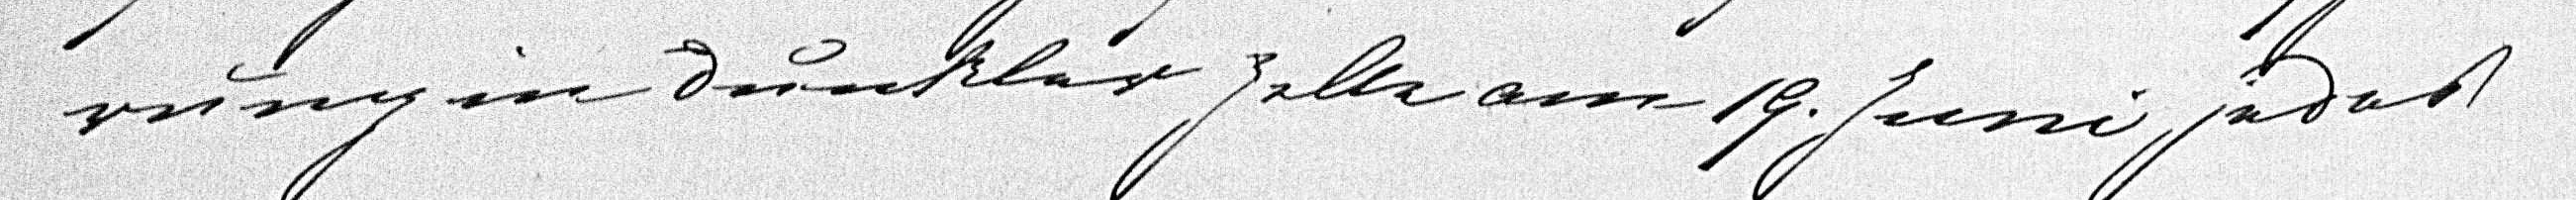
rung in dunkler Zelle am 19. Juni jedes
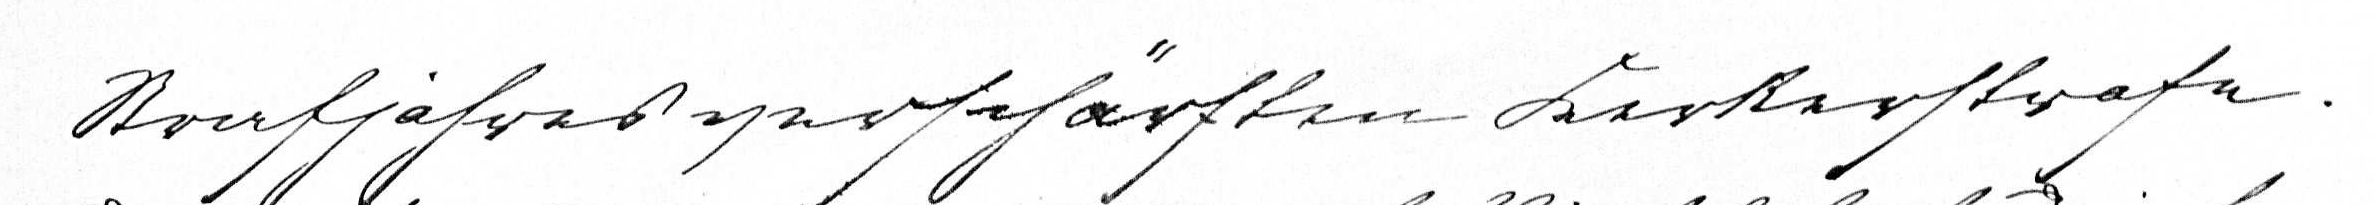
Strafjahres verschärften Kerkerstrafe.
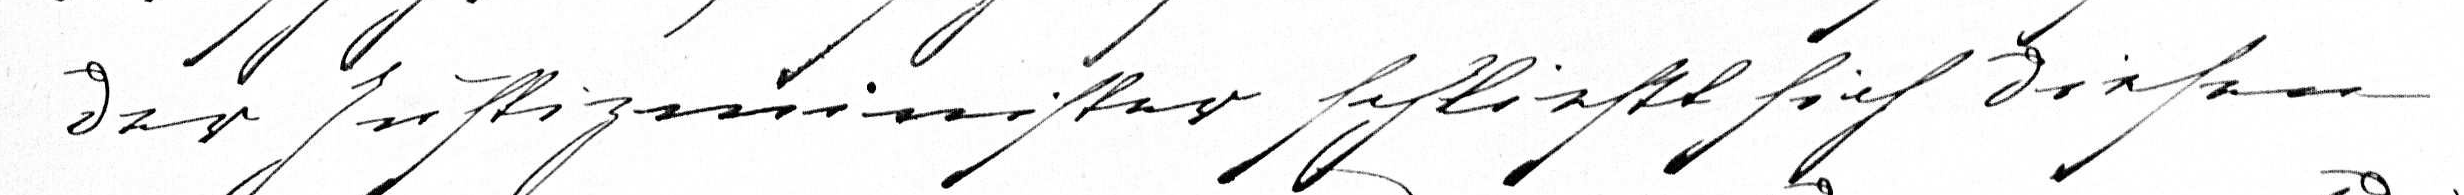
Der Justizminister schließ sich diesen
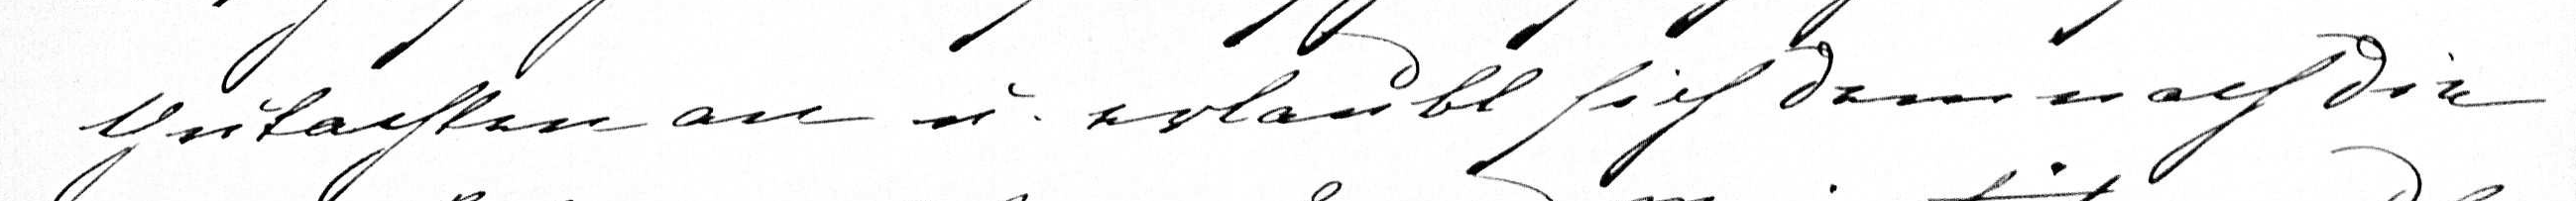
Gutachten an u. erlaubt sich demnach die
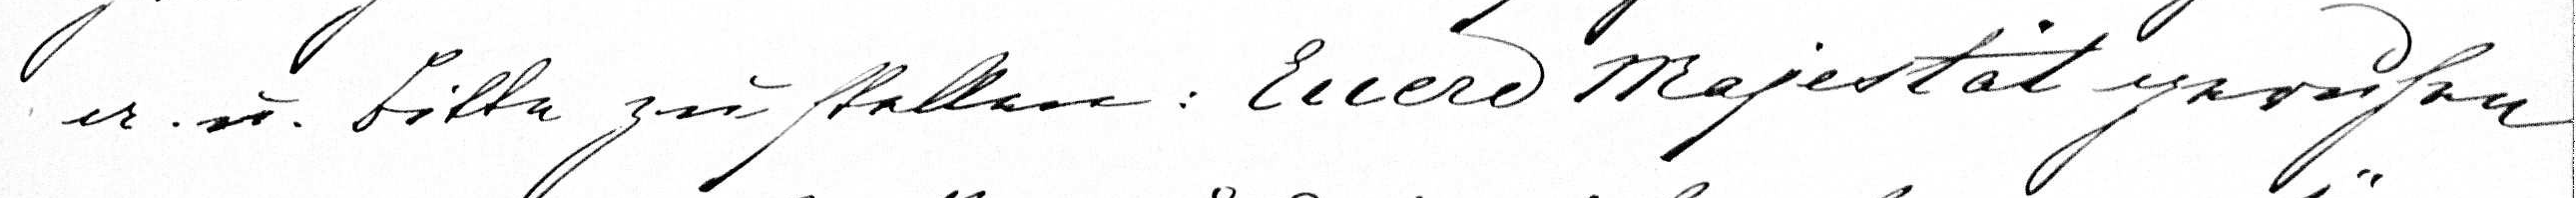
a.u. Bitte zu stellen: Euere Majestät geruhen
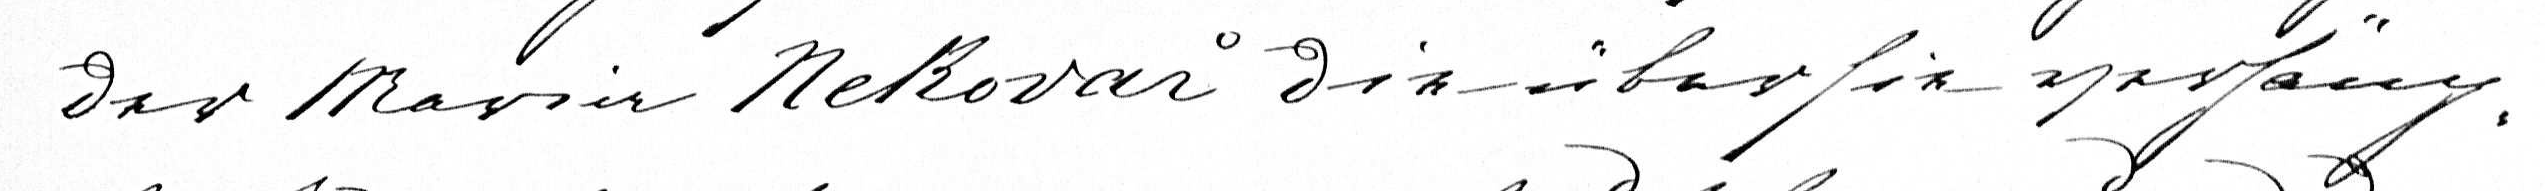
der Maria Nekovař die über sie verhäng¬
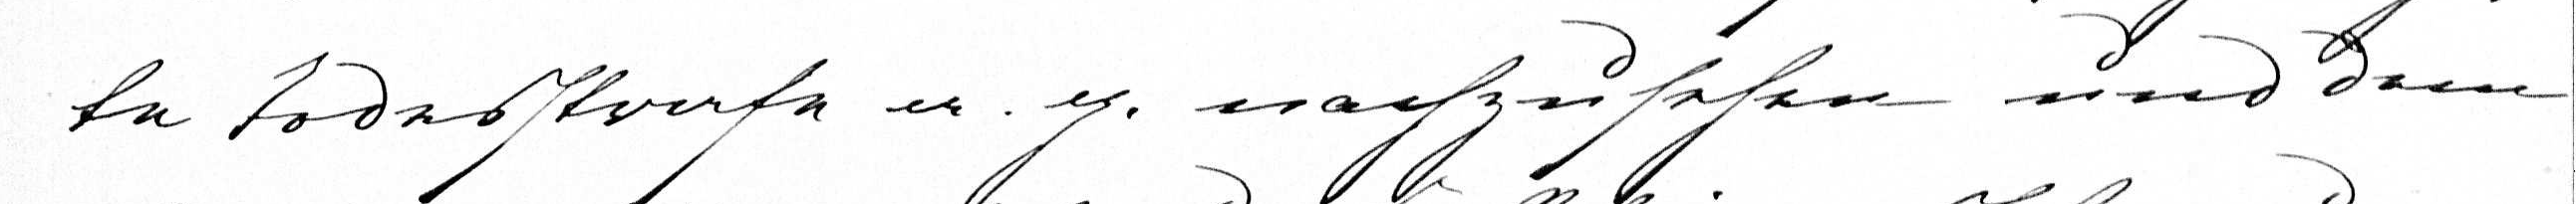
te Todesstrafe a.g. nachzusehen und dem
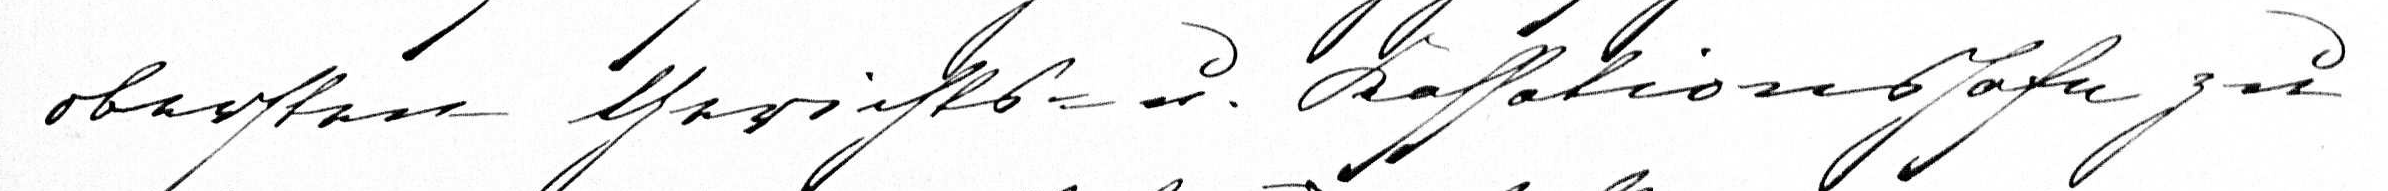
obersten Gerichts- u, Kassationshofe zu
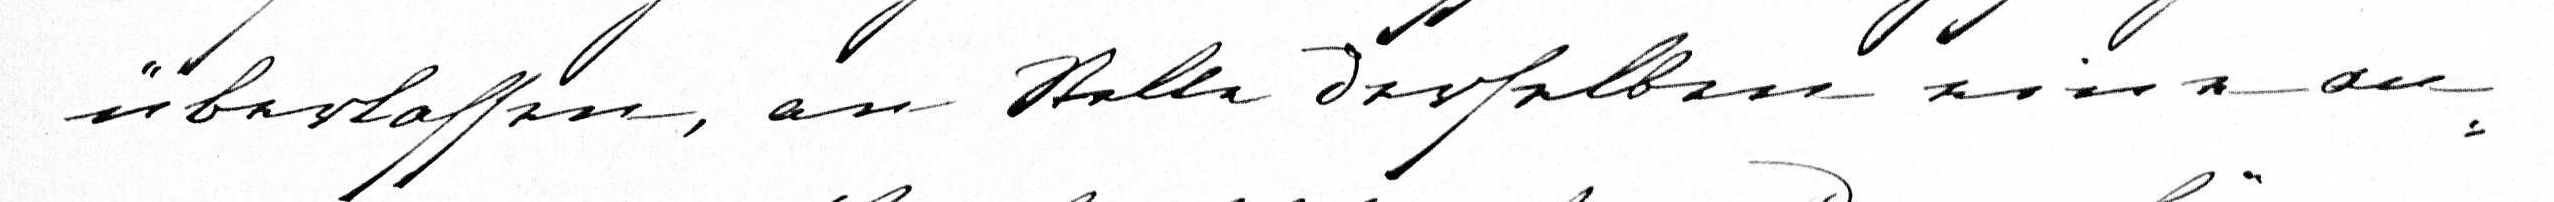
überlassen, an Stelle derselben eine an¬
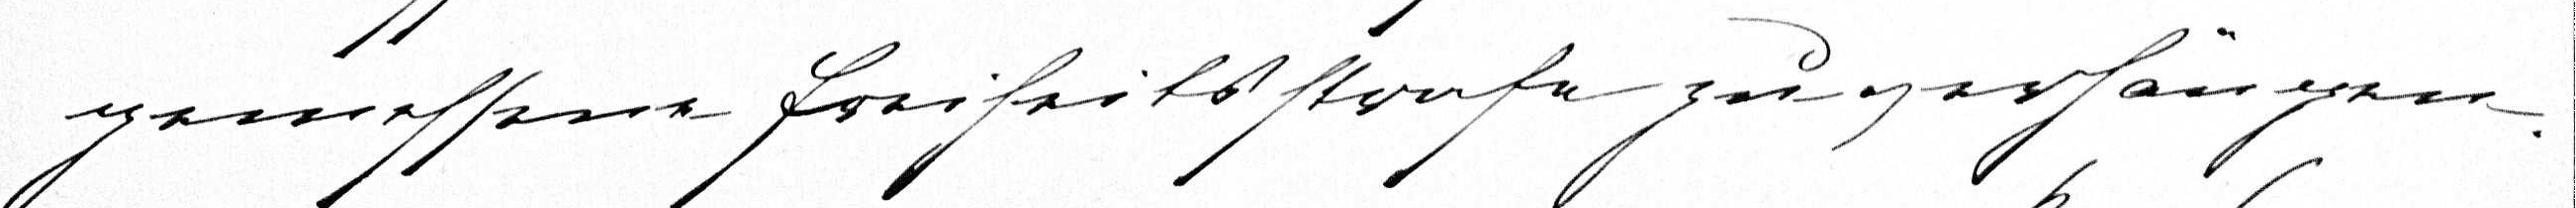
gemessene Freiheitsstrafe zu verhängen.
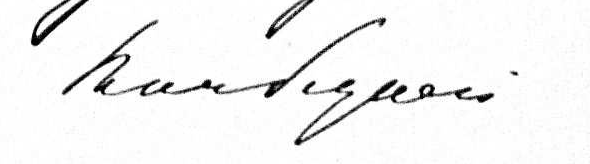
Mardegani
